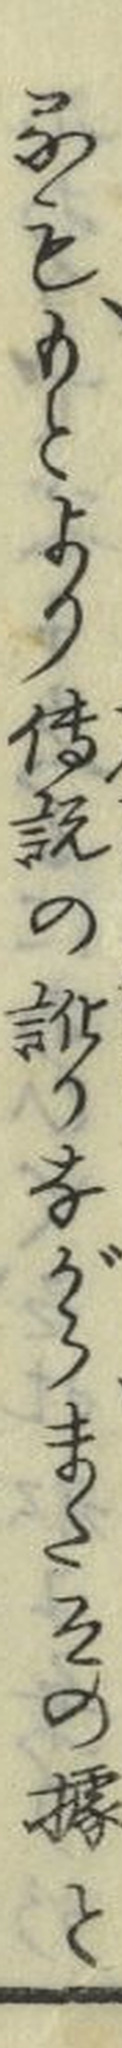るも、もとより伝説の訛りながら、またその拠と
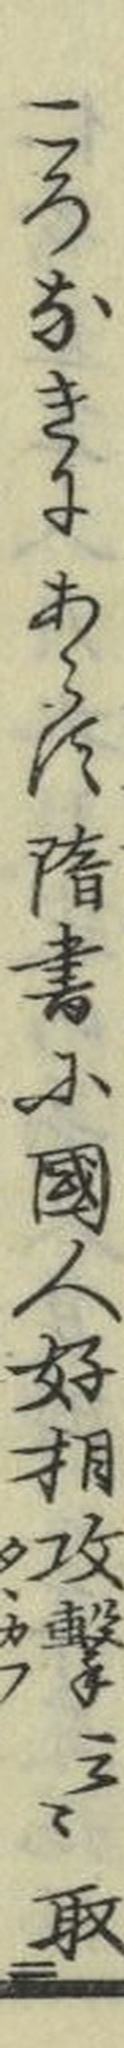ころなきにあらず、隋書に国人好相攻撃云々、取
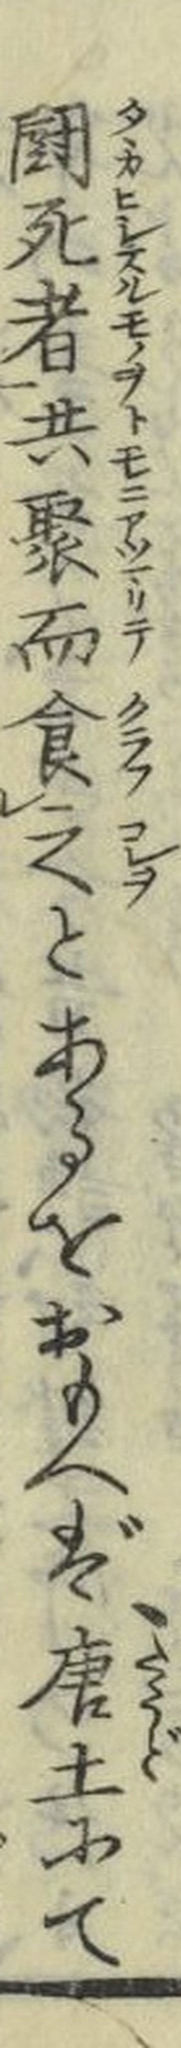闘死者共聚而食之とあるをおもへば、唐土にて
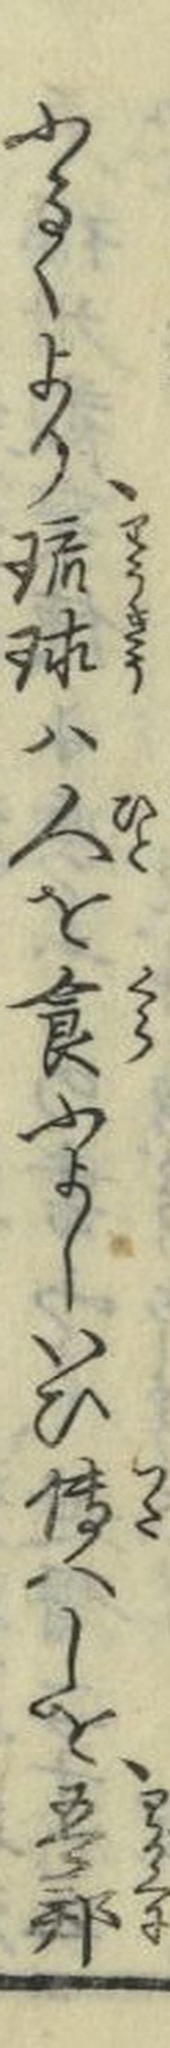ふるくより、琉球は人を食ふよしいひ伝へしを、吾邦
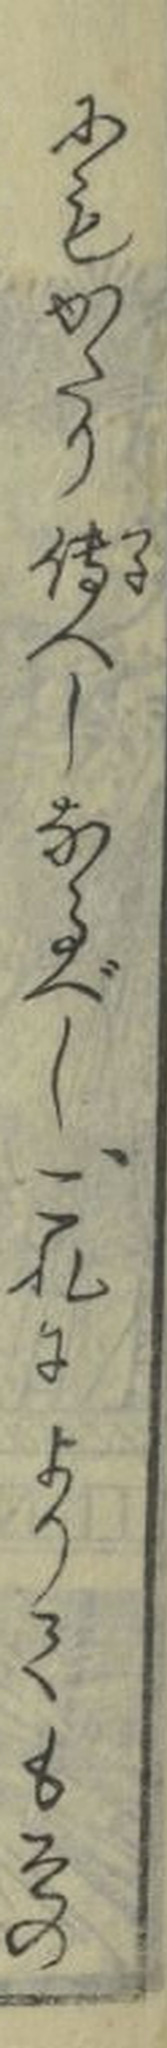にもかたり伝へしなるべし、これによりてもその
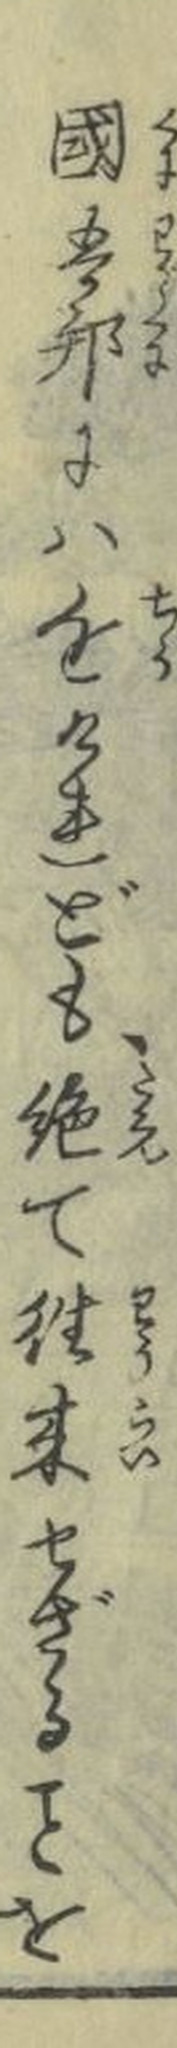国吾邦には近けれども、絶て往来せざることを
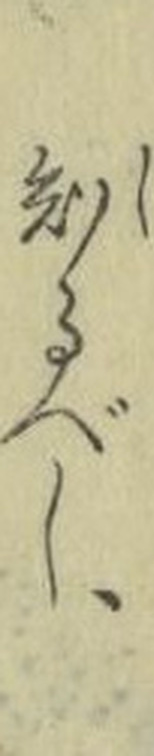知るべし、
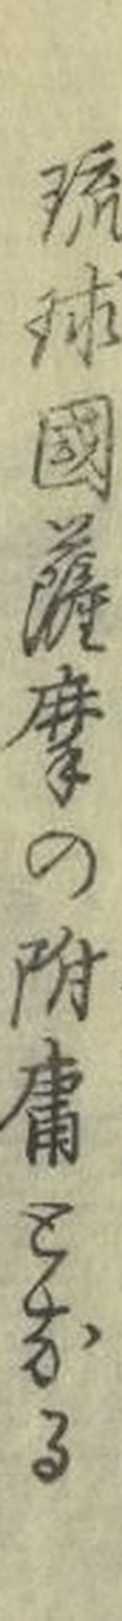琉球国薩摩の附庸となる
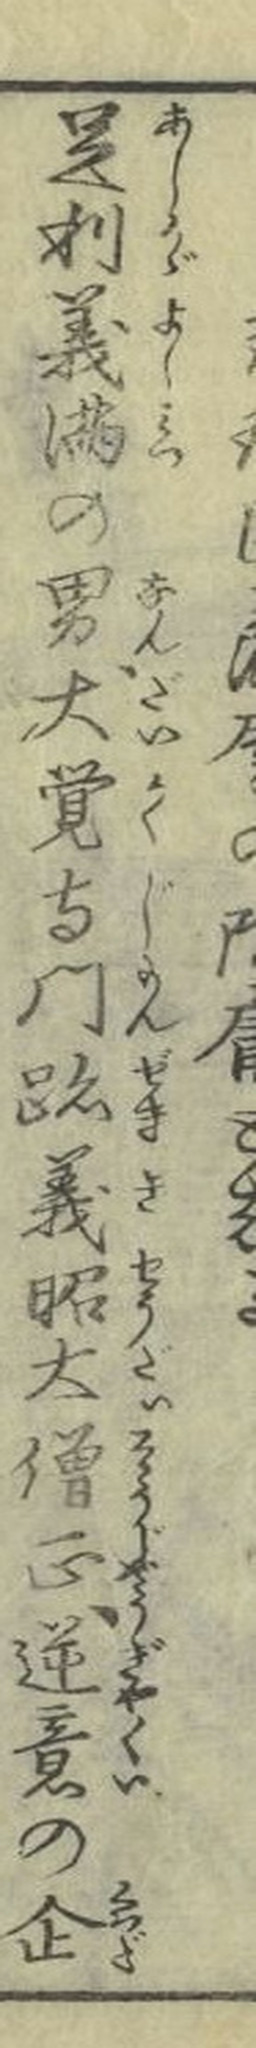足利義満の男、大覚寺門跡義昭大僧正、逆意の企
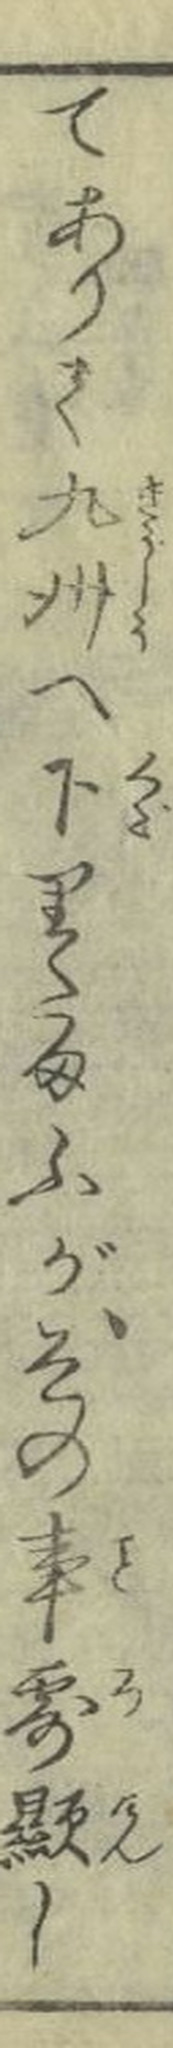てありて九州へ下りたまふが、その事露顕し
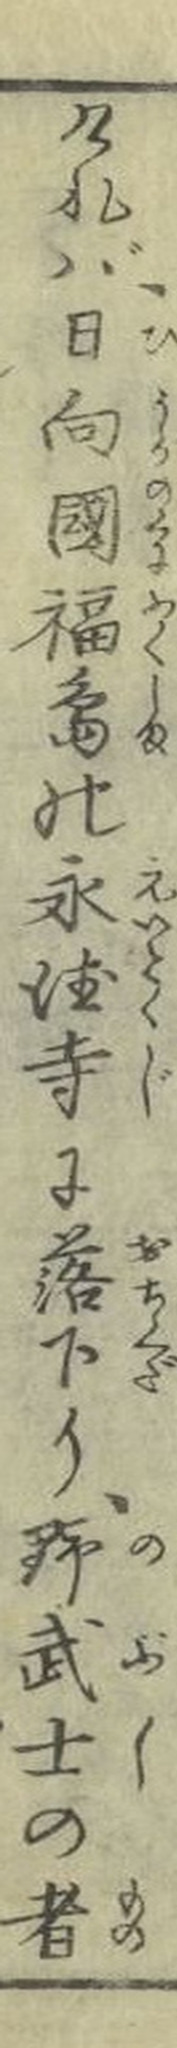ければ、日向国福島の永徳寺に落下り、野武士の者
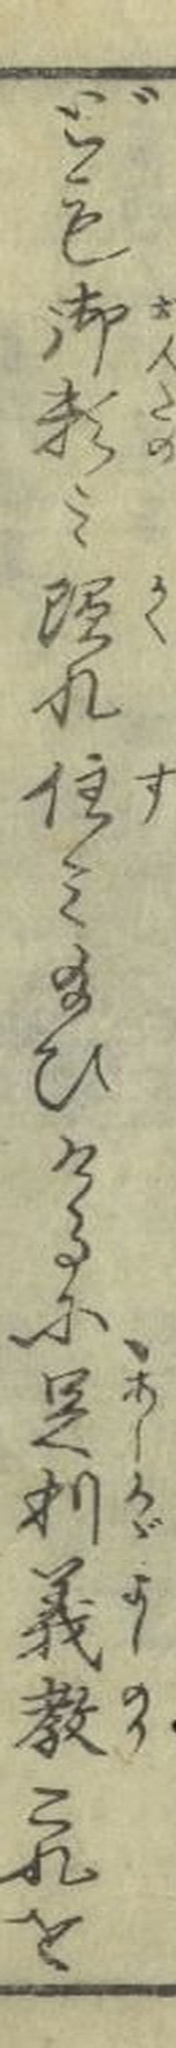ども御頼み隠れ住み給ひけるに、足利義教これを
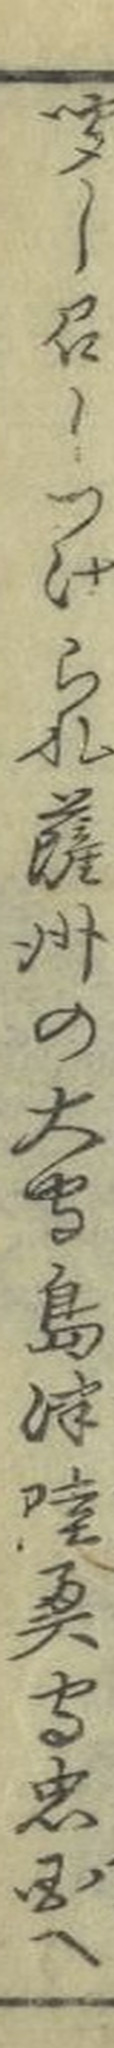聞し召しつけられ、薩州の大守島津陸奥守忠国へ

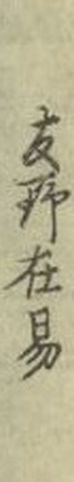友野在易
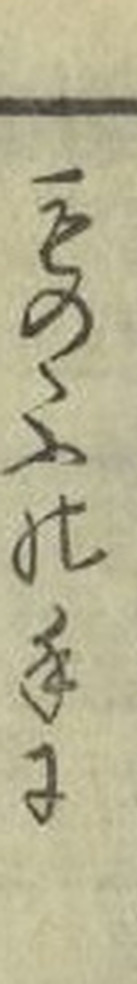ものゝふの手に
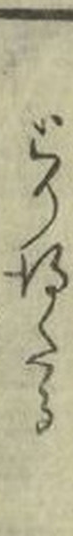とり得たる
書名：琉球入貢紀略
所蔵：University of the Ryukyus Library
